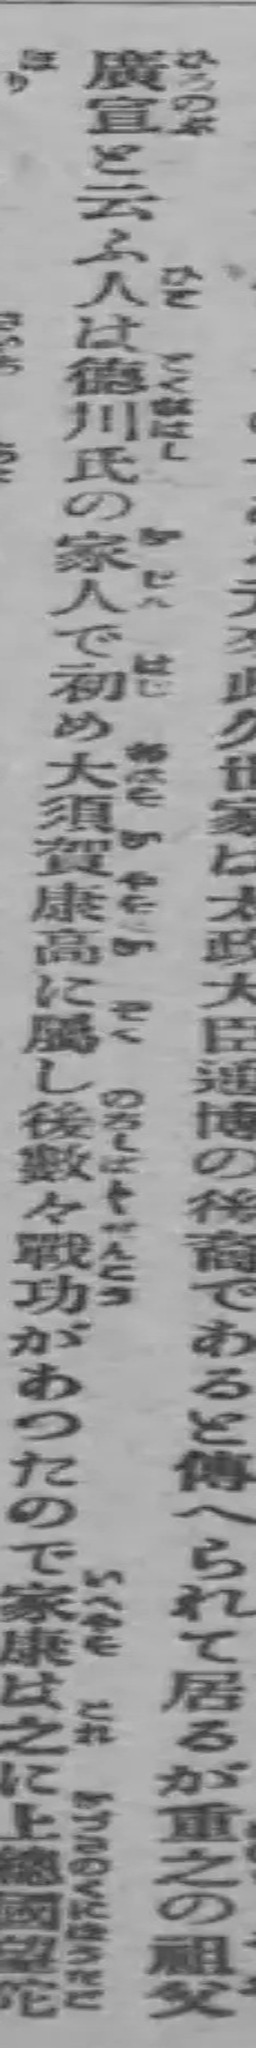広宣と云ふ人は徳川氏の家人で初め大須賀康高に属し後屡々戦功があつたので家康は之に上総国望陀
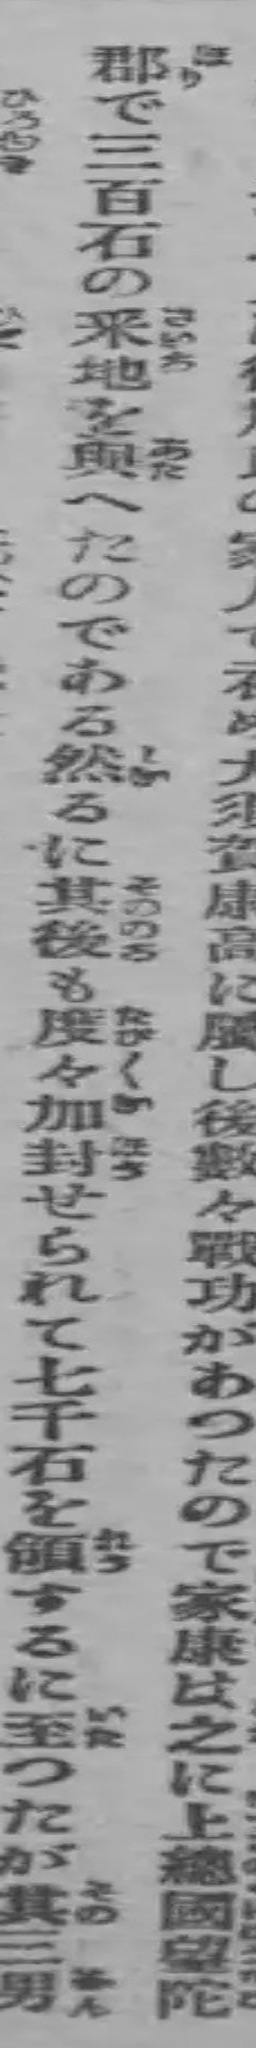久世広之郡で三百石の采地を与へたのである然るに其後も度々加封せられて七千石を領するに至つたが其三男
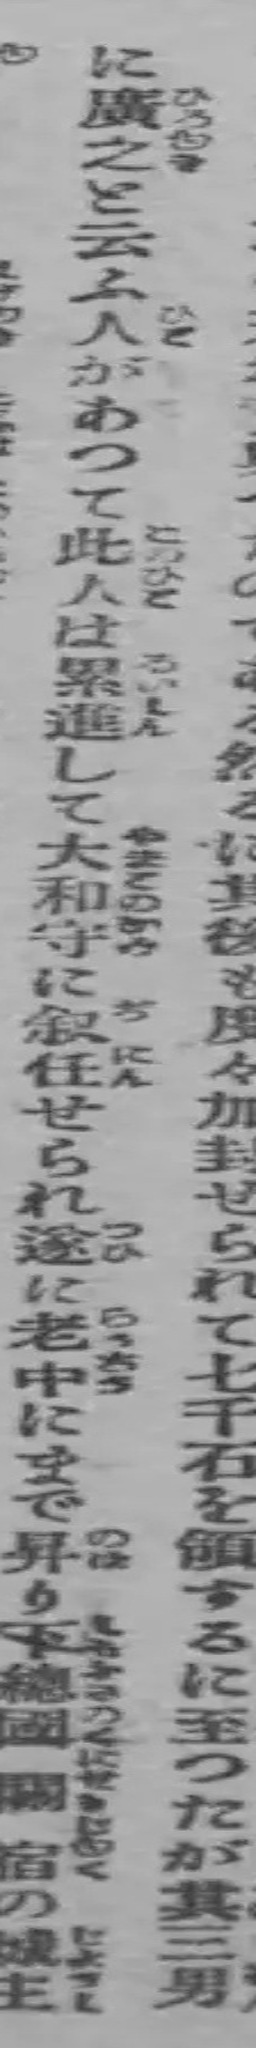に広之と云ふ人があつて此人は累進して大和守に叙任せられ遂に老中にまで昇り下総国関宿の城主
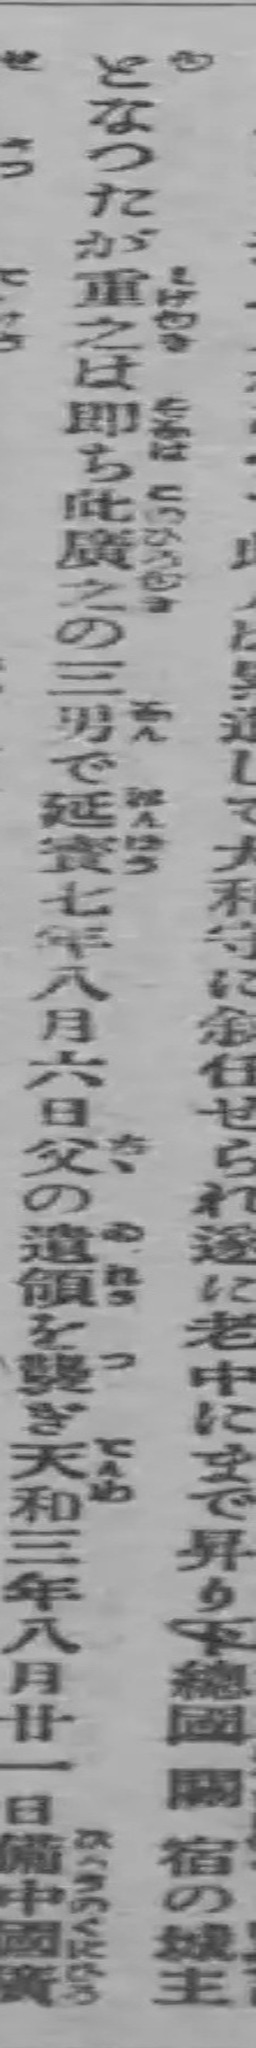となつたが重之は即ち此広之の三男で延宝七年八月六日父の遺領を襲ぎ天和三年八月廿一日備中国広
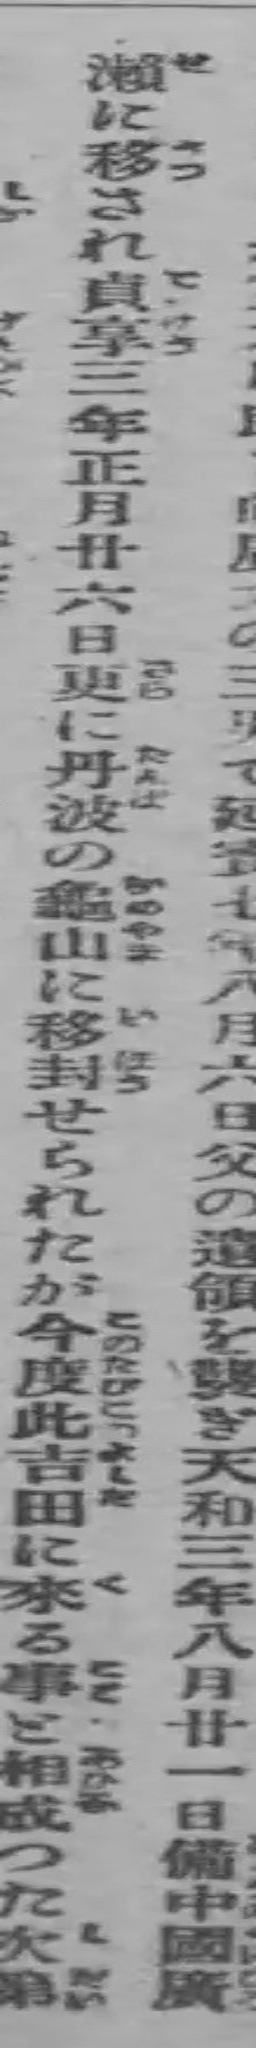瀬に移され貞享三年正月廿六日更に丹波の亀山に移封せられたが今度此吉田に来る事と相成つた次第
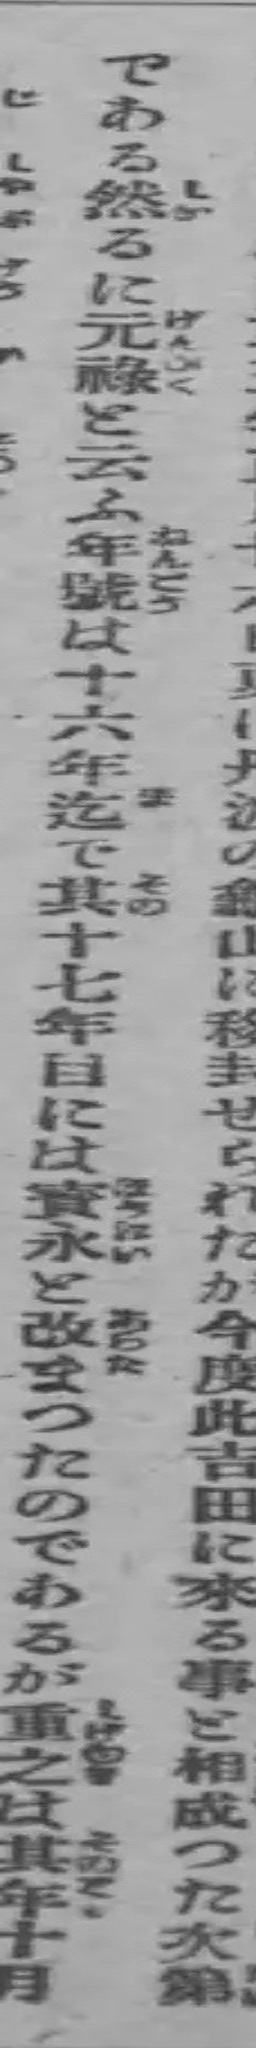である然るに元禄と云ふ年号は十六年迄で其十七年目には宝永と改まつたのであるが重之は其年十月
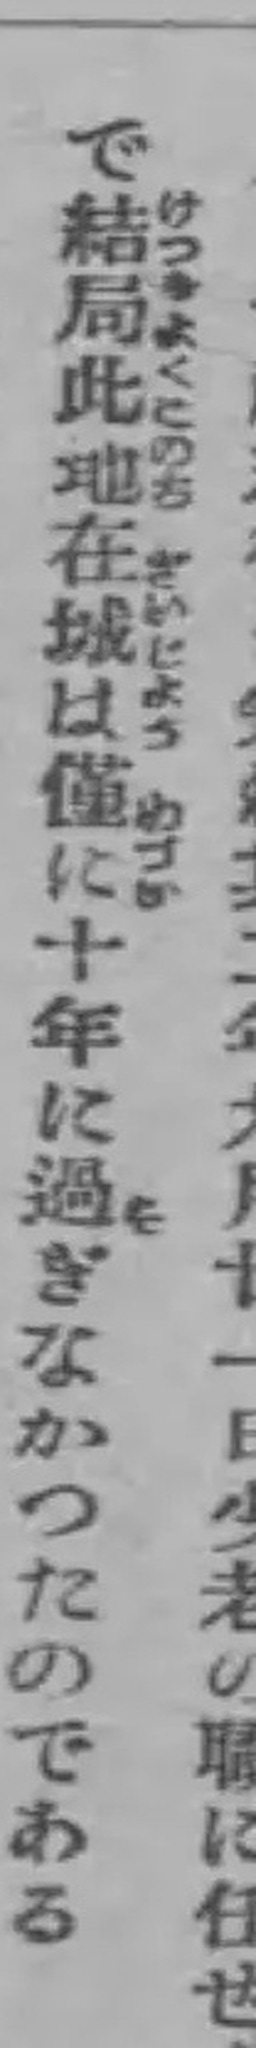で結局此地在城は僅に十年に過ぎなかつたのである
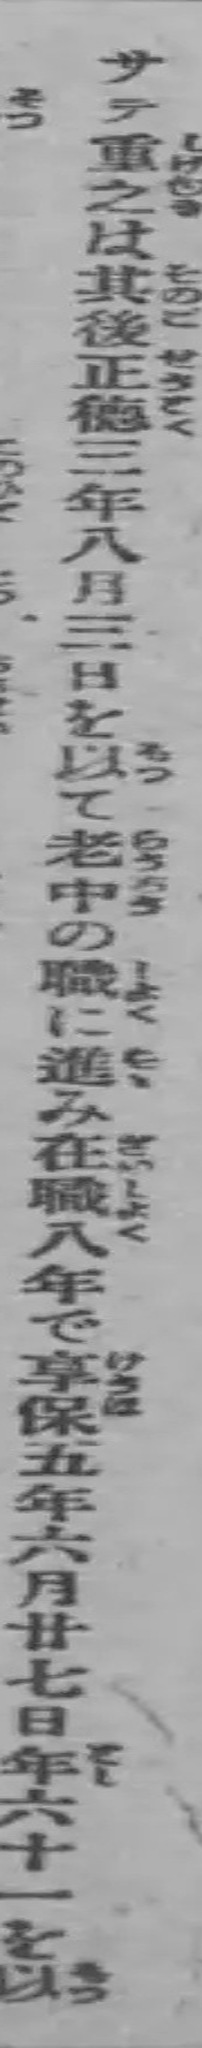サテ重之は其後正徳三年八月三日を以て老中の職に進み在職八年で享保五年六月廿七日年六十一を以
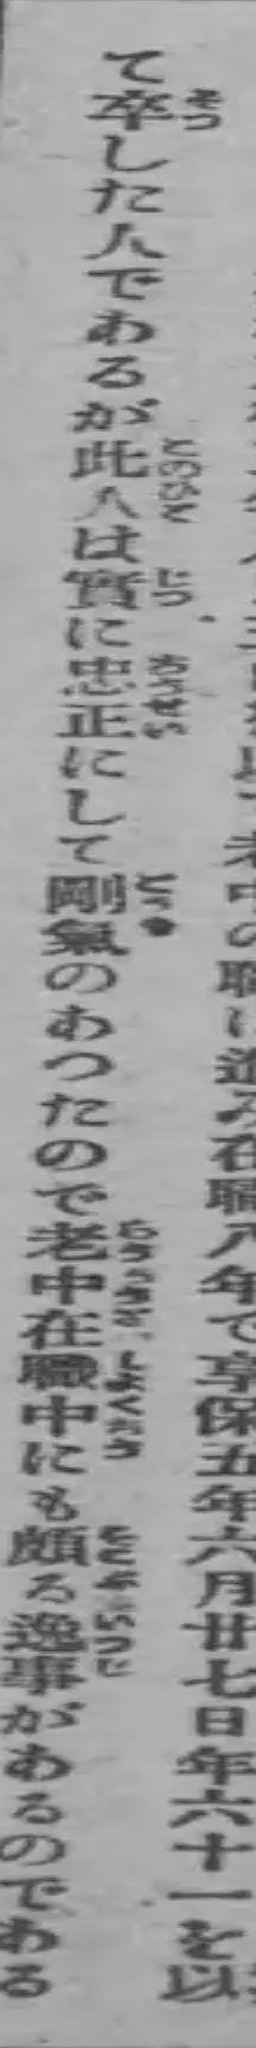て卒した人であるが此人は実に忠正にして剛気のあつたので老中在職中にも頗る逸事があるのである
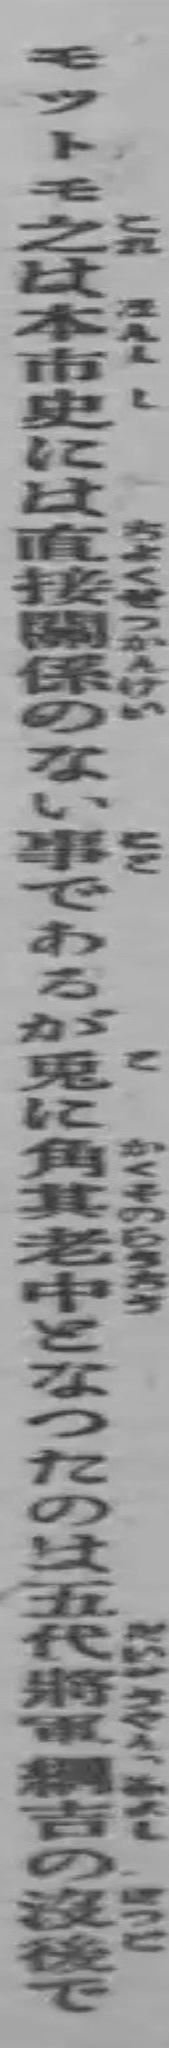モツトモ之は本市史には直接関係のない事であるが兎に角其老中となつたのは五代将軍綱吉の没後で
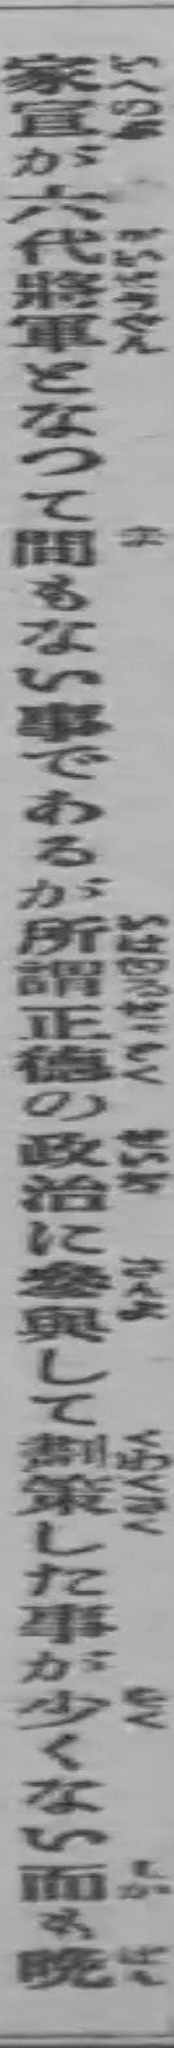家宣が六代将軍となつて間もない事であるが所謂正徳の政治に参与して劃策した事が少くない而も晩
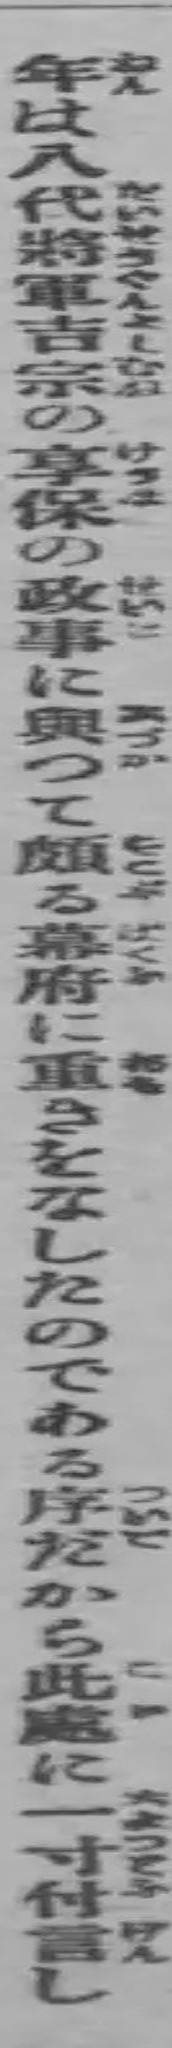年は八代将軍吉宗の享保の政事に与つて頗る幕府に重きをなしたのである序だから此処に一寸付言し
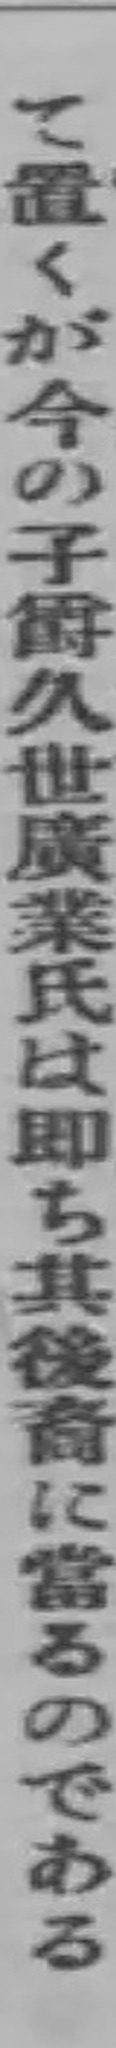て置くが今の子爵久世広業氏は即ち其後裔に当るのである
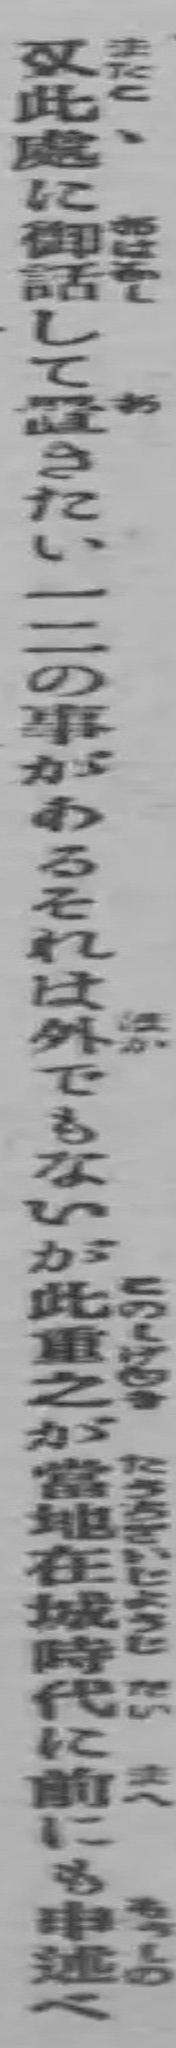又此処に御話して置きたい一二の事があるそれは外でもないが此重之が当地在城時代に前にも申述べ
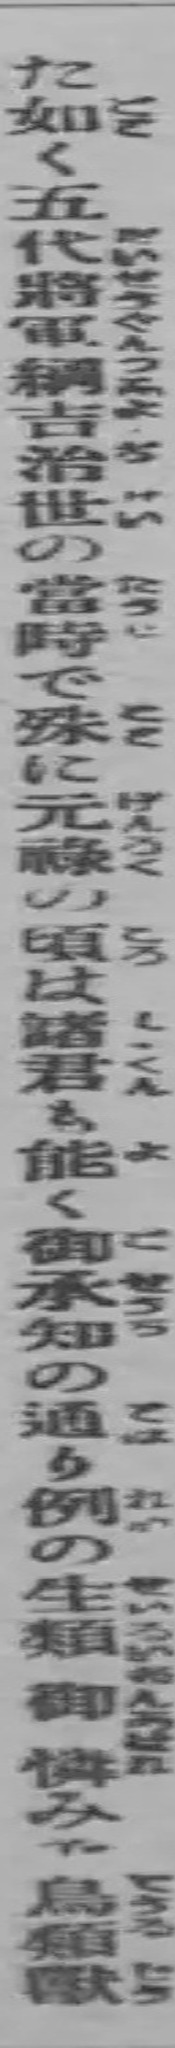生類御憐みた如く五代将軍綱吉治世の当時で殊に元禄の頃は諸君も能く御承知の通り例の生類御憐みで鳥類獣
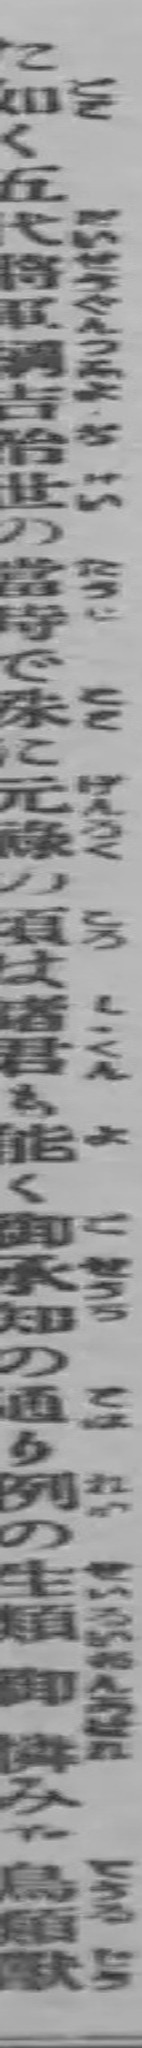生類御憐みた如く五代将軍綱吉治世の当時で殊に元禄の頃は諸君も能く御承知の通り例の生類御憐みで鳥類獣
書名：豊橋市史談
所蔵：国立国会図書館 National Diet Library, JAPAN
